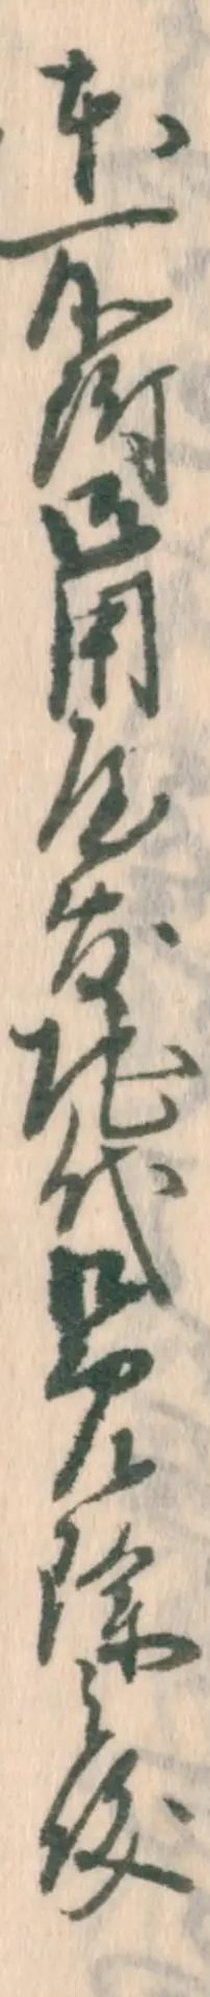│本所附御用屋敷地代御免除之儀
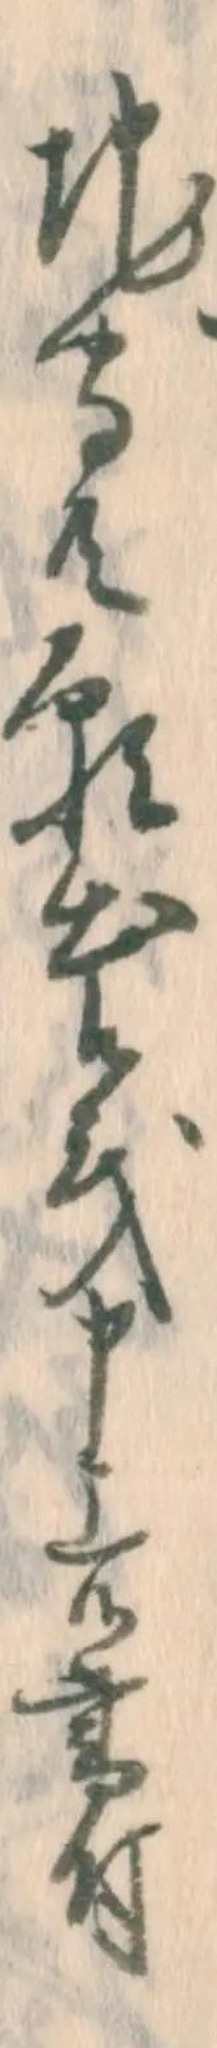│地守共願出候義申上候書付
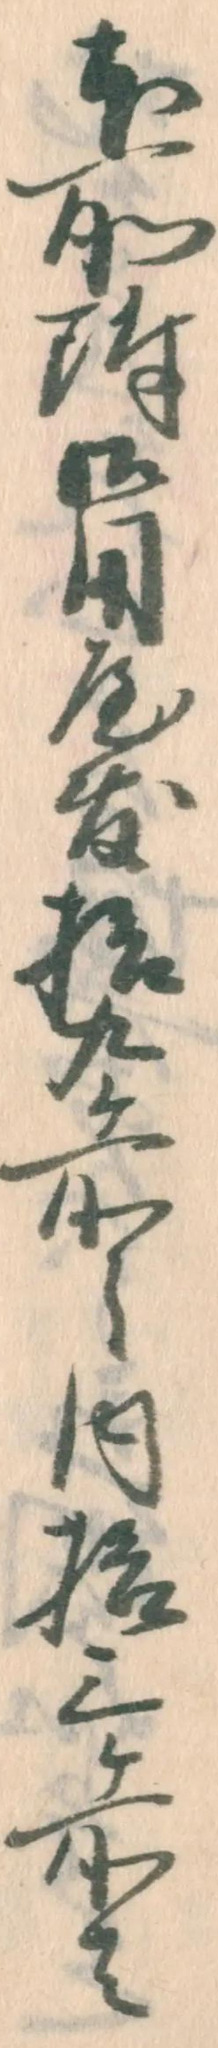本所附御用屋敷拾九ヶ所之内拾三ヶ所は
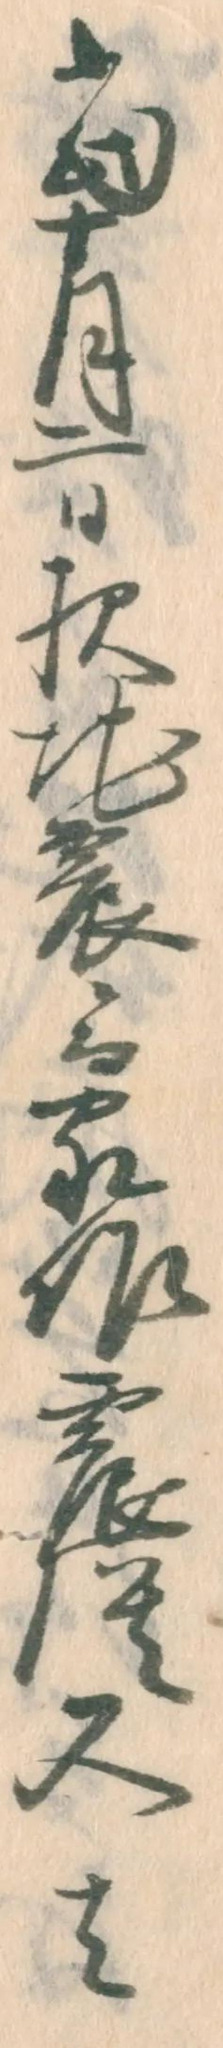当十月二日夜地震ニ而家作震潰又は

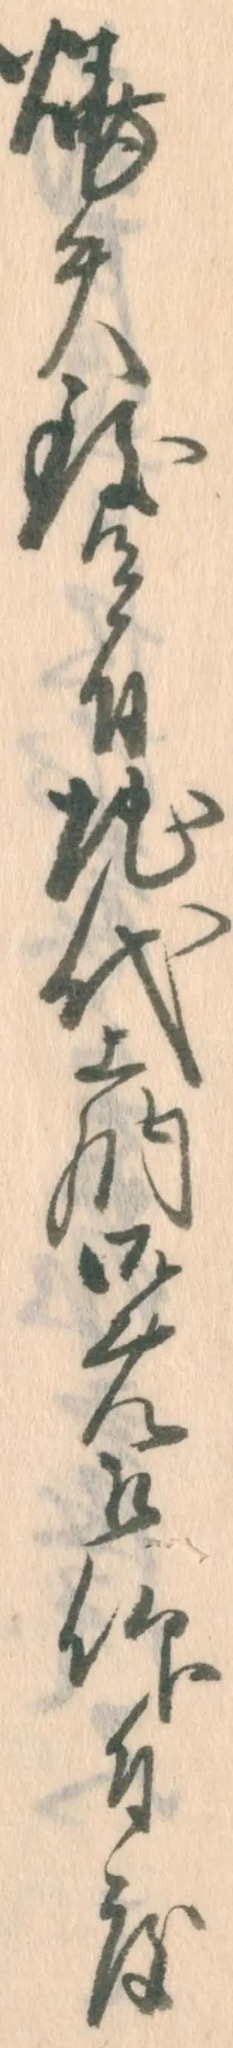焼失致候ニ付地代上納御免被仰付度
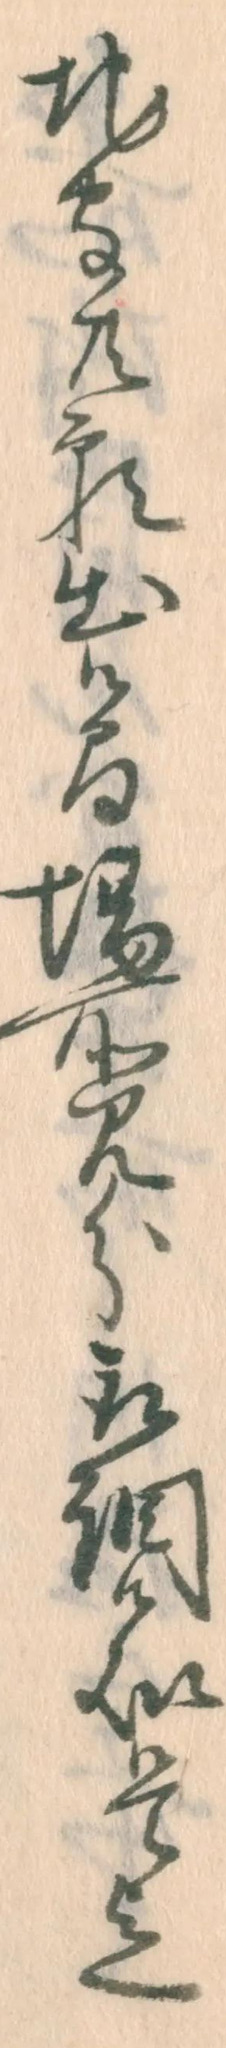地守共願出候間場所見分取調候処是迄
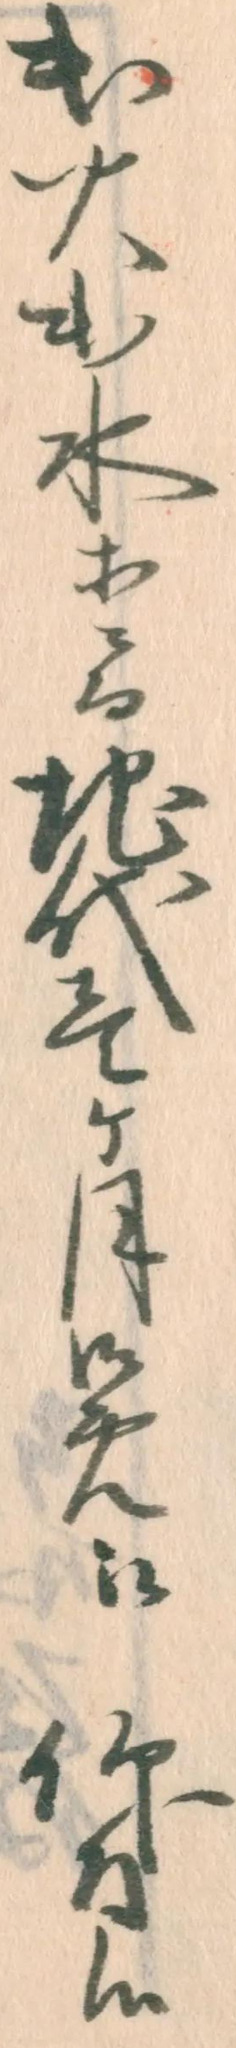出火出水等に而地代壱ヶ月御免被仰付候
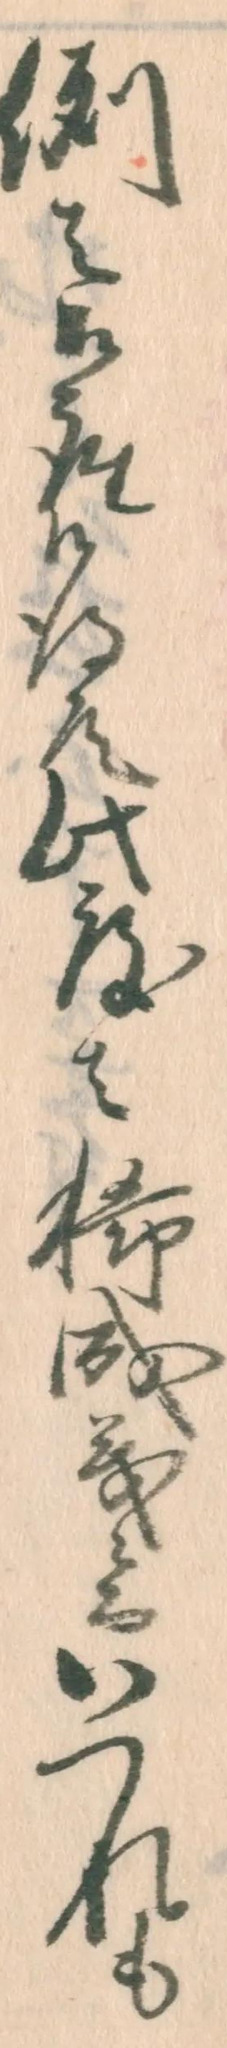例は御座候得共此度は稀成義に而いつれも
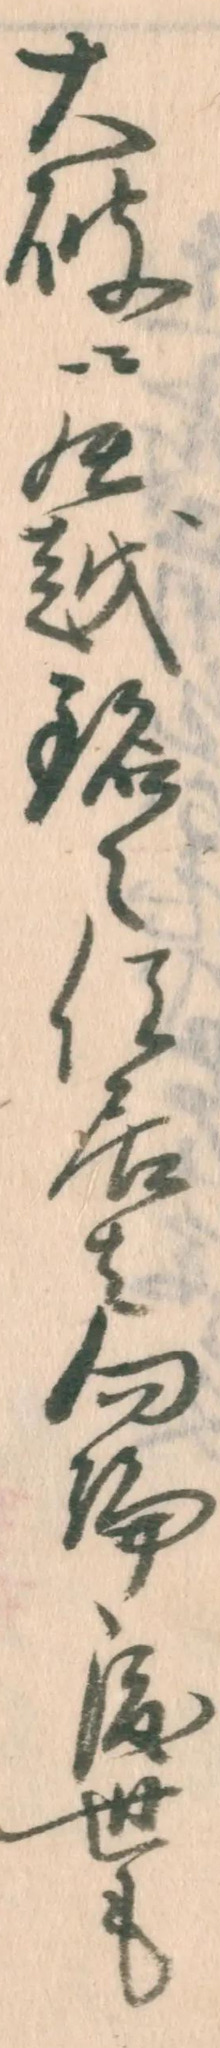大破に罷越銘々住居は勿論渡世も
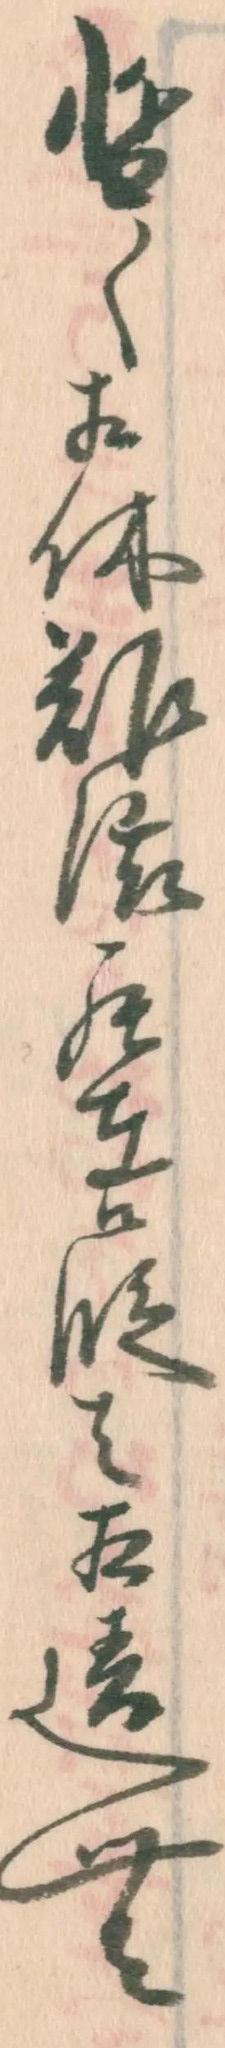暫く相休難渋罷在候段は相違無
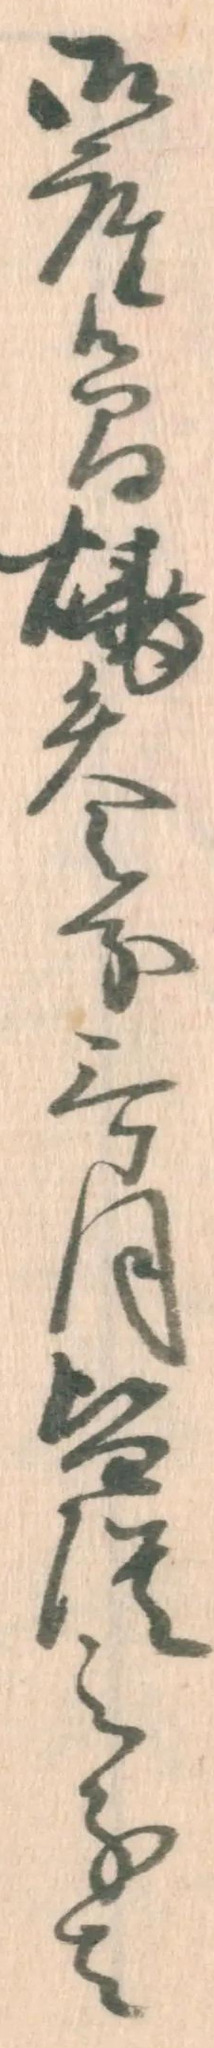御座候間焼失之分三ヶ月皆潰之分は
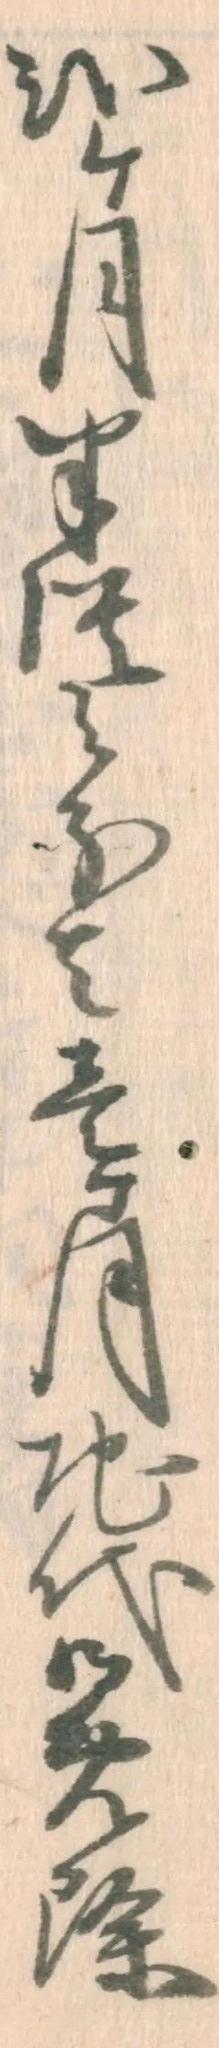弐ヶ月半潰之分は壱ヶ月地代御免除
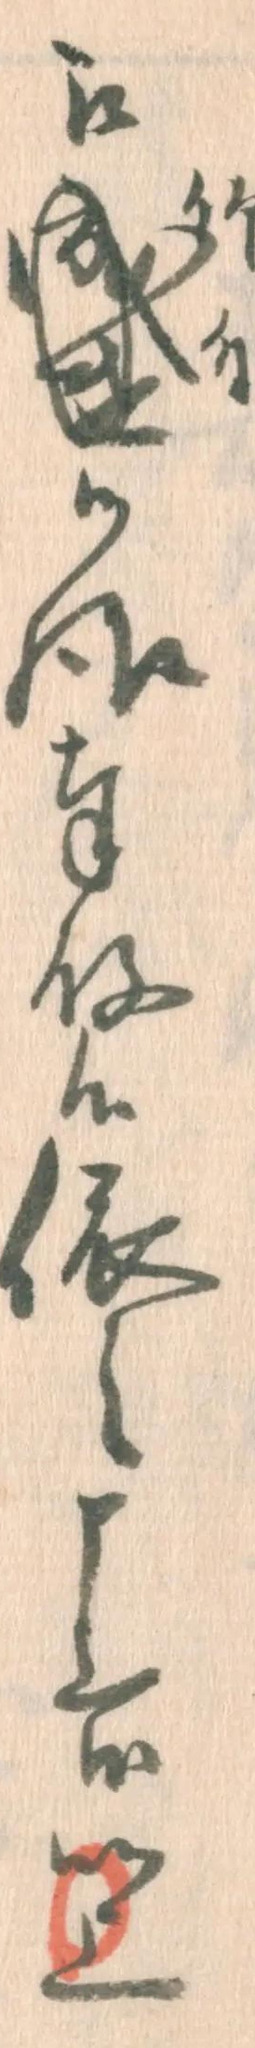被仰付候様奉存候依之申上候以上

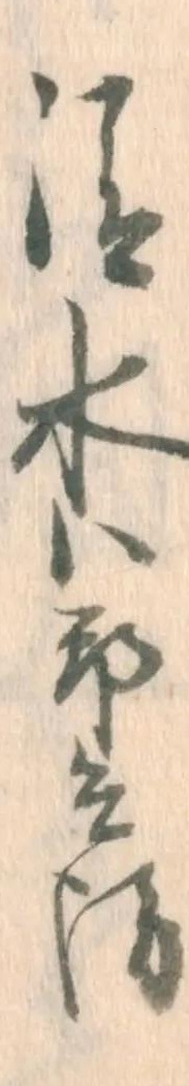清水八郎兵衛
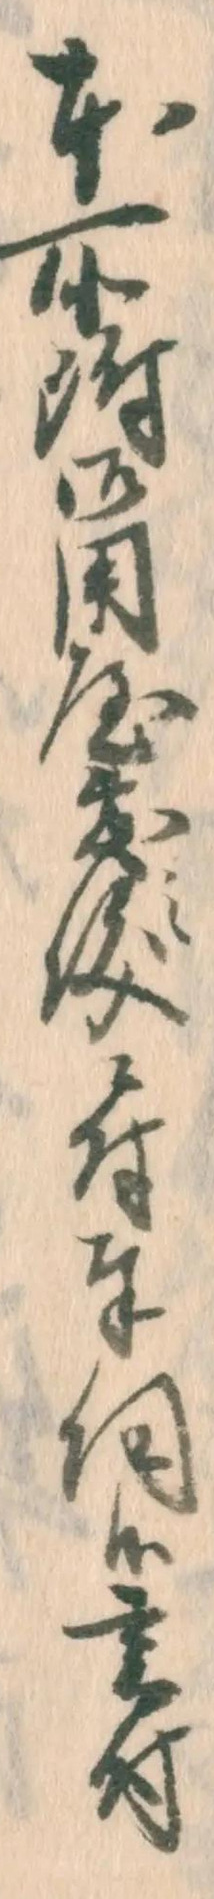│本所附御用屋敷之儀ニ付奉伺候書付
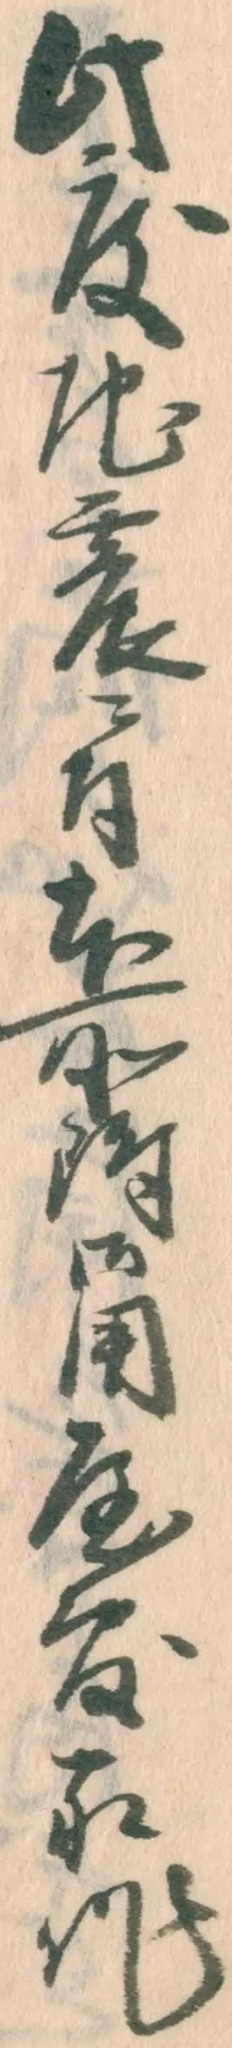此度地震ニ付本所附御用屋敷家作
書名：地震災書留 2巻. [1] 内表紙に「地震災書留　安政二卯年　但本所深川御用屋敷地代免除調」とあり
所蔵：国立国会図書館 National Diet Library, JAPAN
